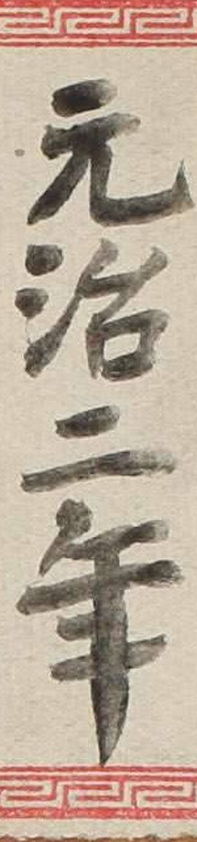元治二年

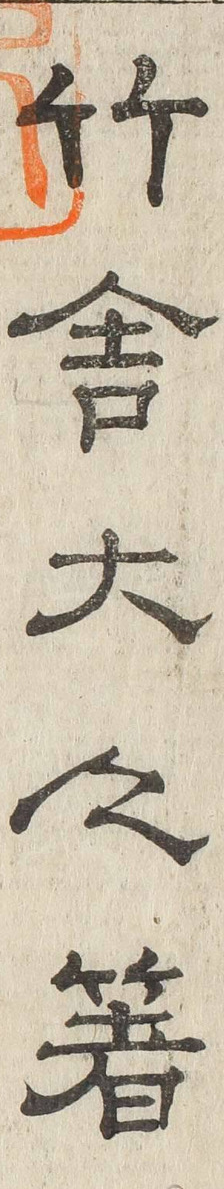竹舎大介著
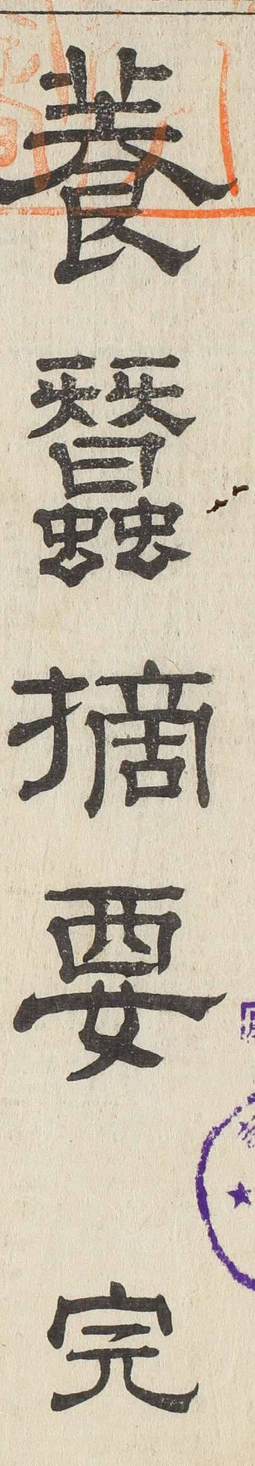養蚕摘要完
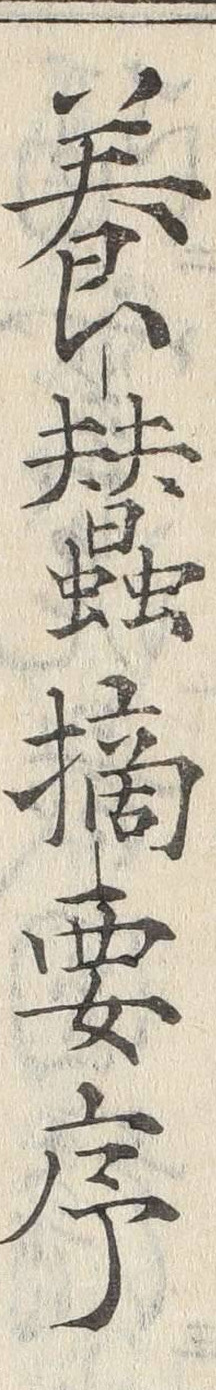養-蚕摘-要序

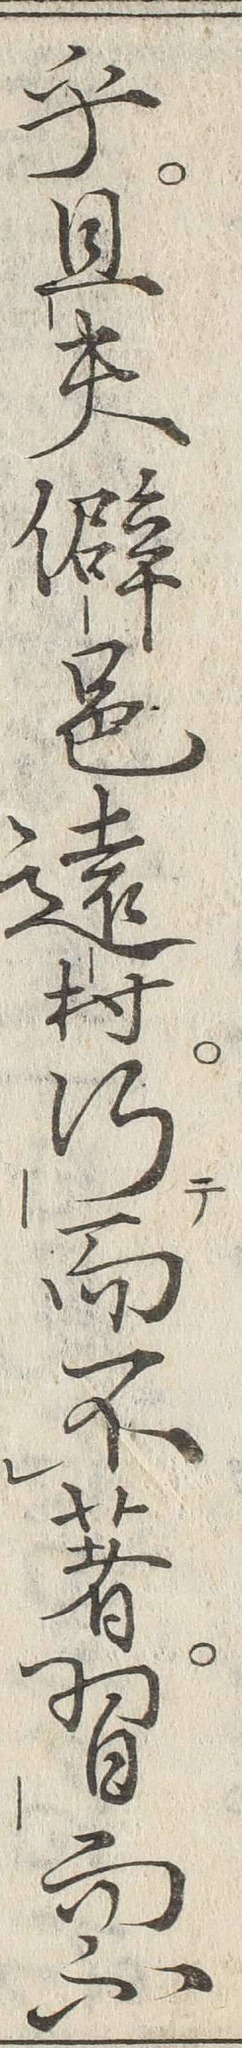乎。且-夫僻-邑遠-村。行-而不著。習-而不

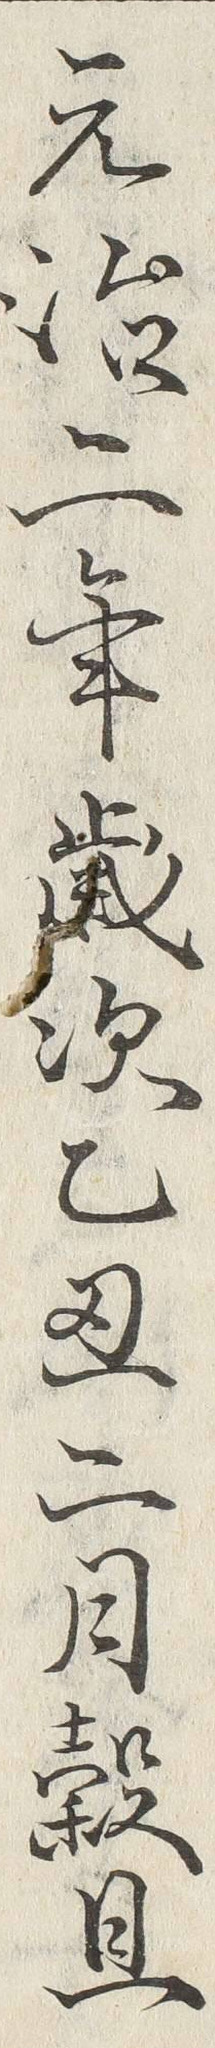元治二年歳次乙丑二月穀旦
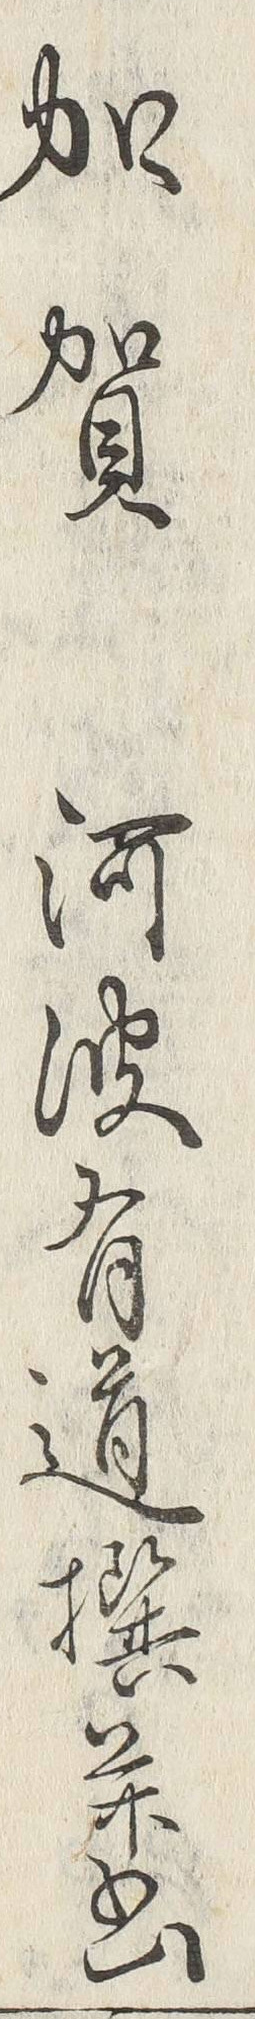加賀河波有道撰幷画
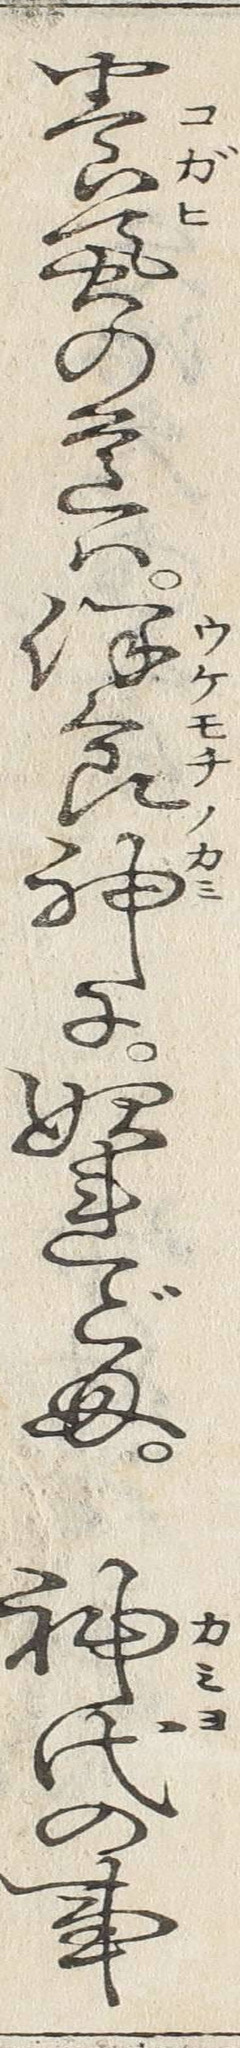養蚕の道は。保食神に。始れども。神代の事
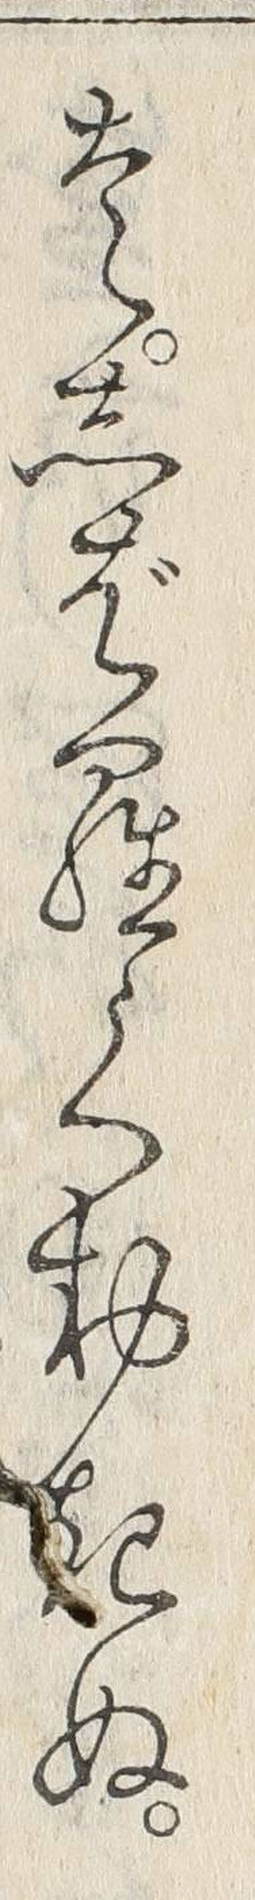は。しばらくおきぬ。
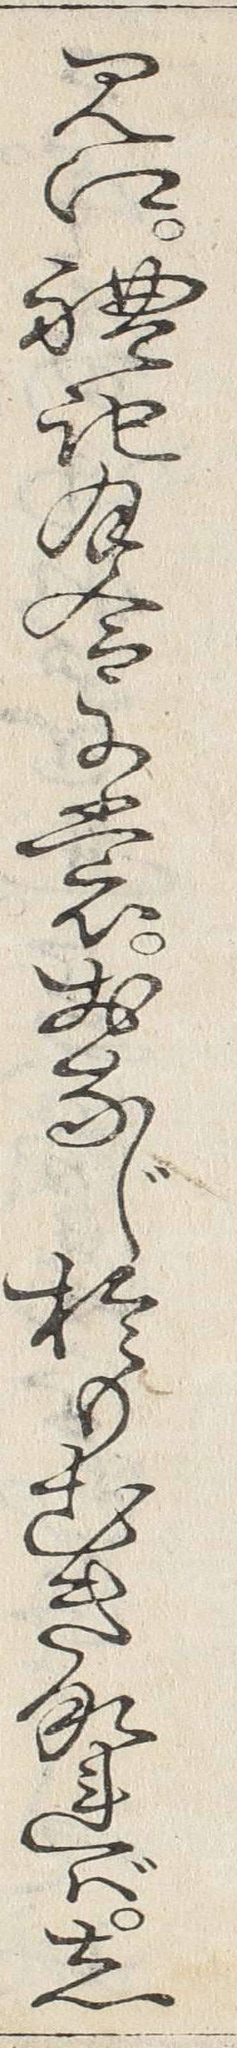みえ。礼記月令にも。おなじおもむきなれば。し
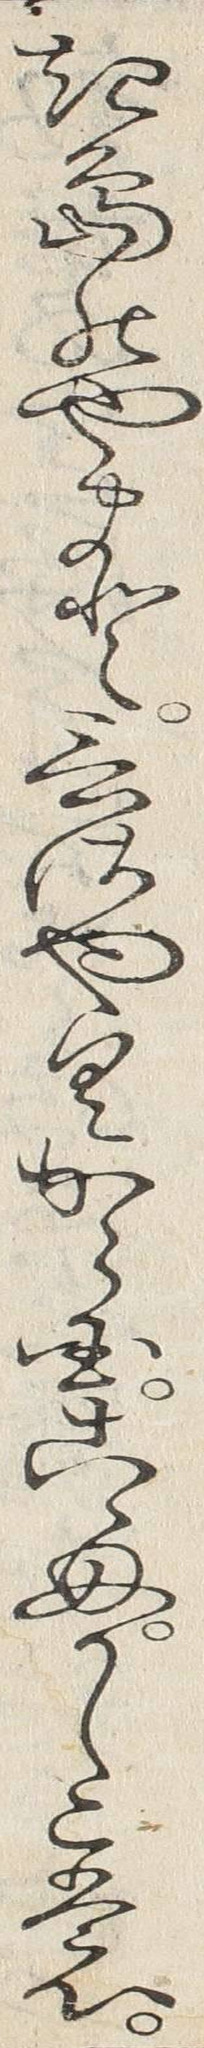き島のやまと。言さやくから国。こも。かしこも。
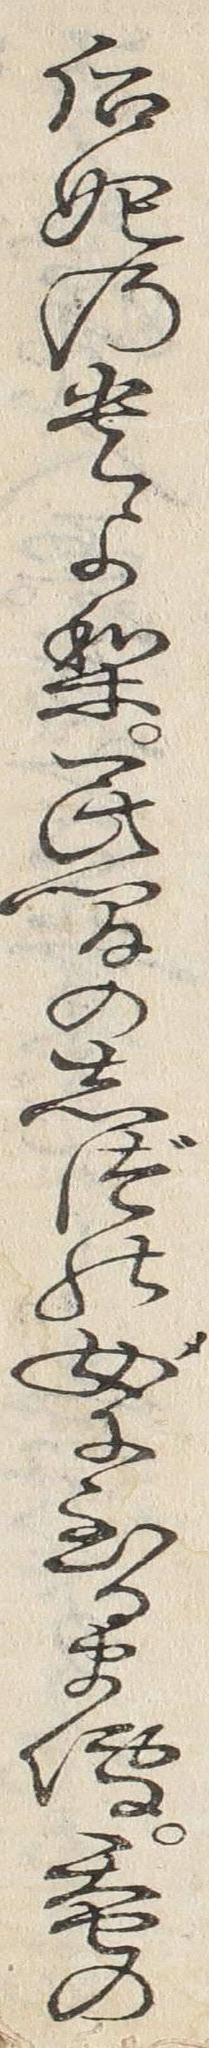后妃の貴より。民間のしづの女に至るまて。の

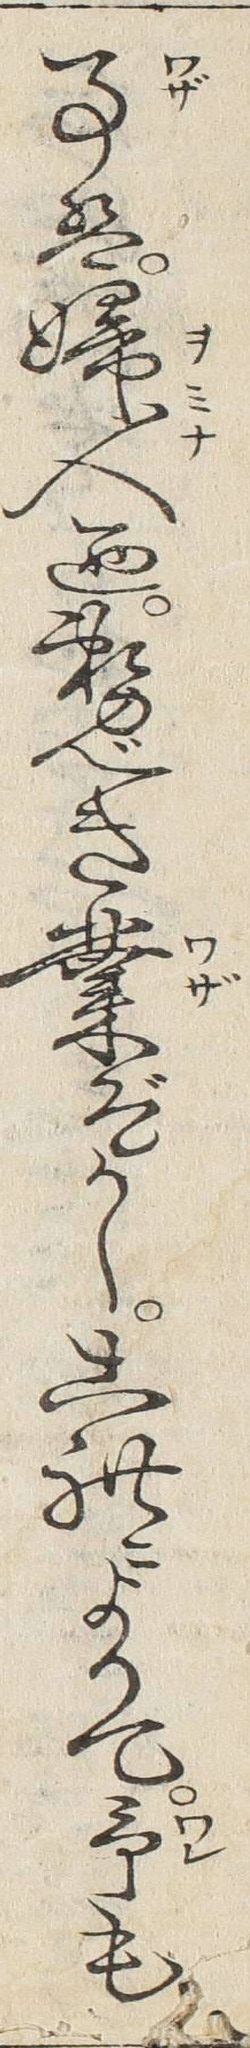事は。婦人の。務べき業ぞかし。これによりて。予も
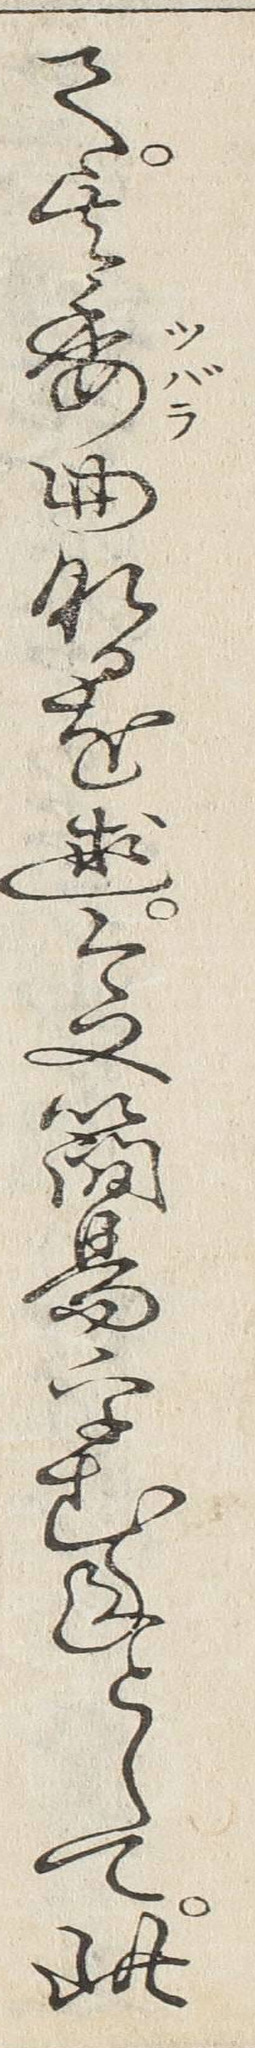て。其委曲なるを述。今又簡易をむねとして。此
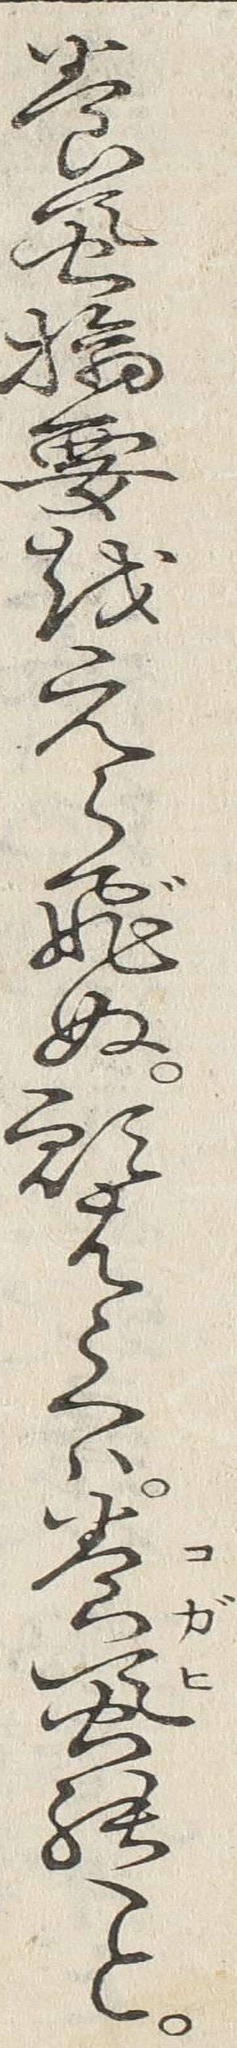養蚕摘要をえらびぬ。願はくは。養蚕のこと。
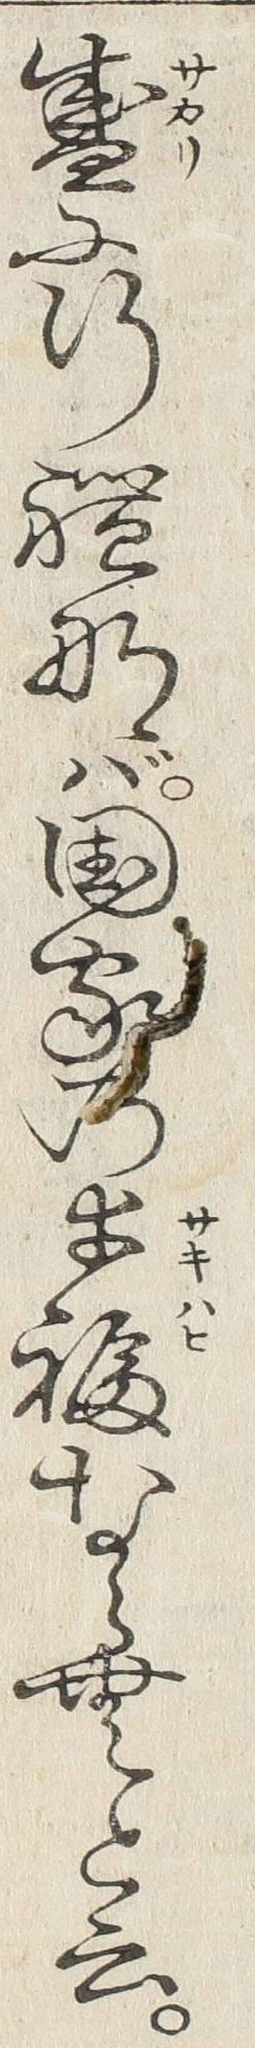盛に行れなば。国家の幸福ならむと云。
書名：養蠶摘要
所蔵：東京大学農学生命科学図書館 国文学研究資料館
